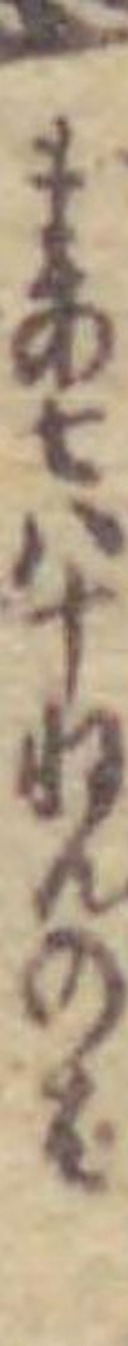まあ七八十ねんのば
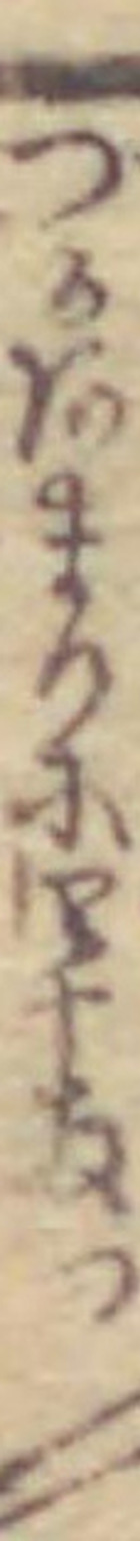つかあまりに四十両つ
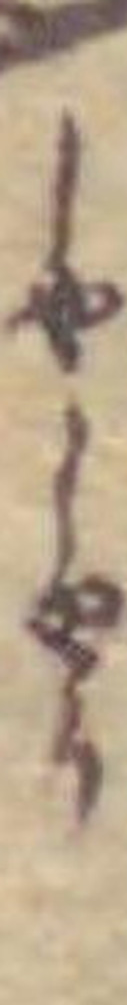しやしやう
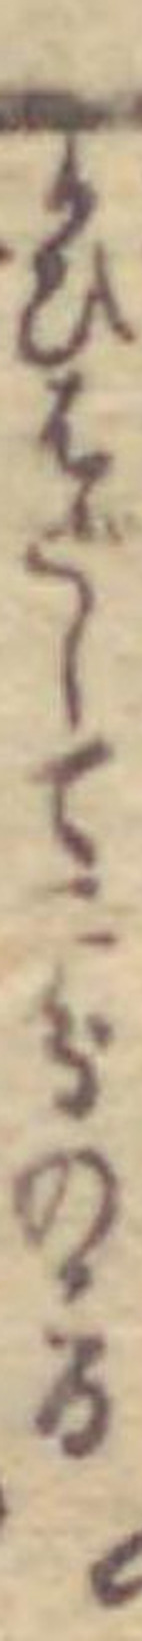かひはだして二分のこる
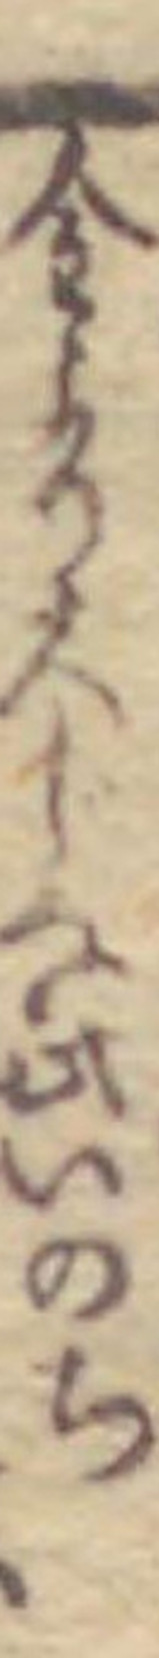金より大じな此いのち
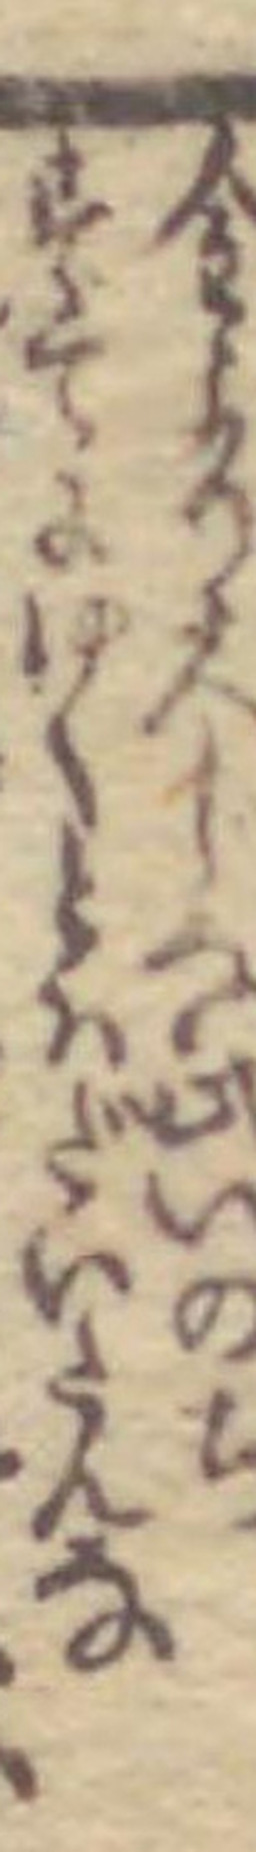すてにゆくとはだいたんな
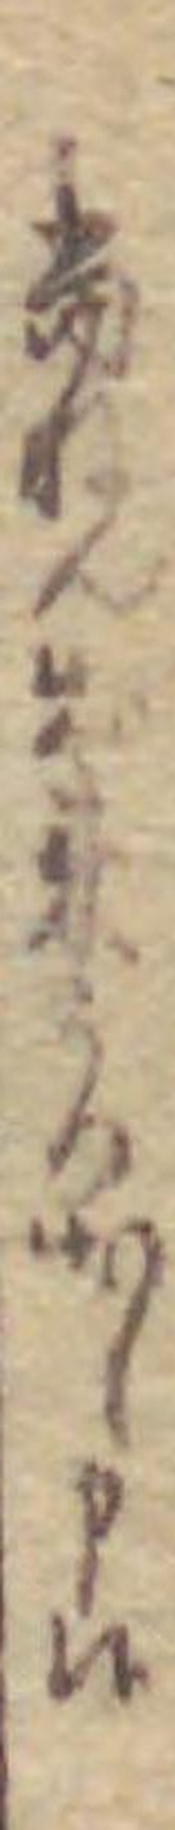当ねん出来うり出し申候
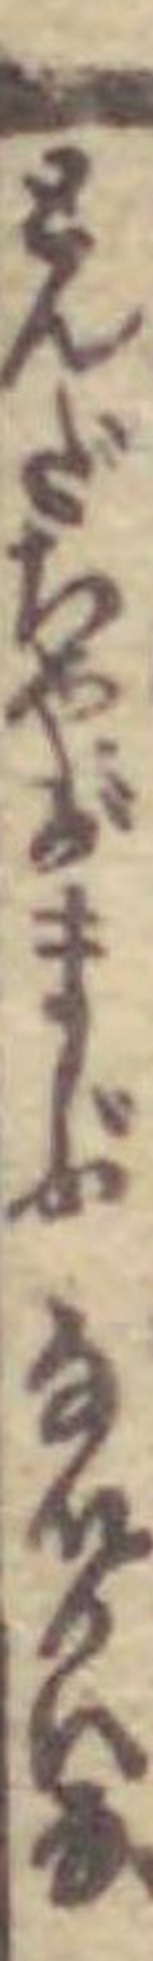とんだちやがまじやないかいな
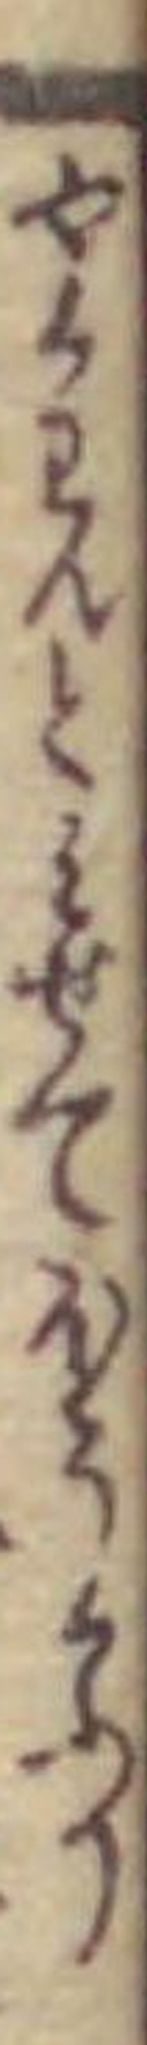やかわんとみせてほうかふり
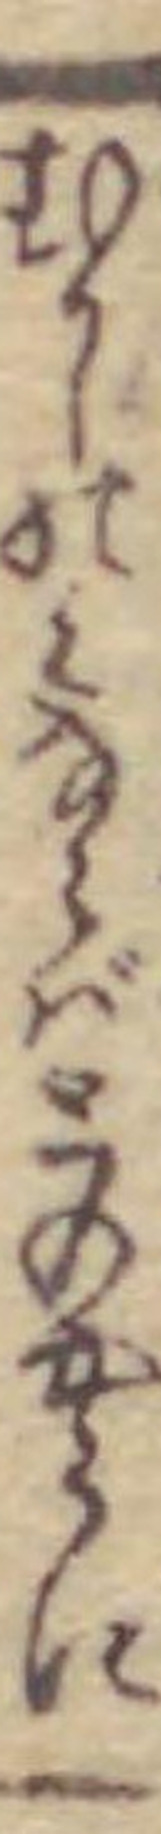むかしのことならばとのやうに
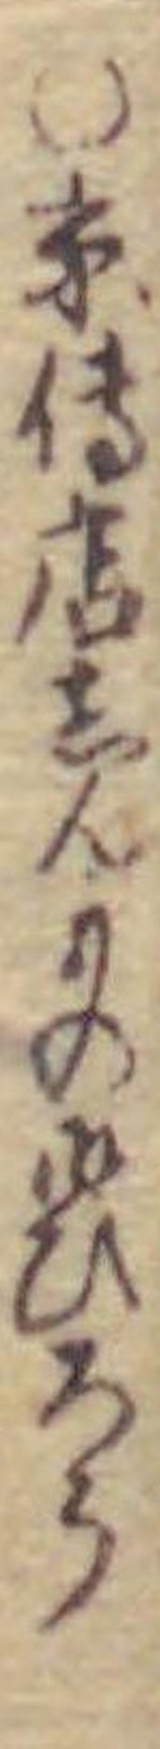○京伝店しんもの御ひろう
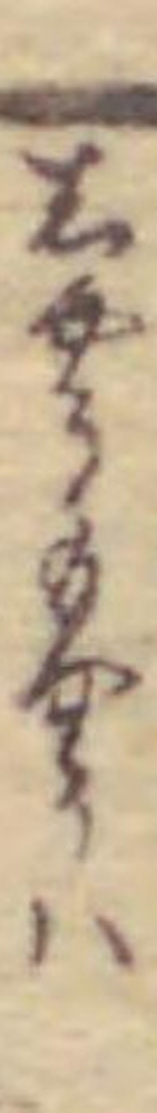しやうもやうは
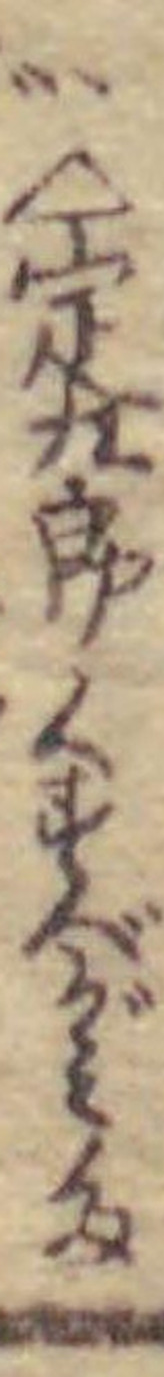△定九郎くすべがみた
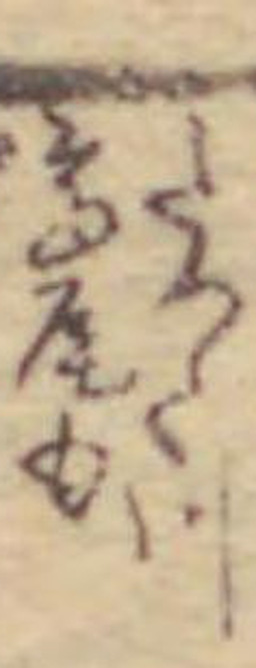高尾も
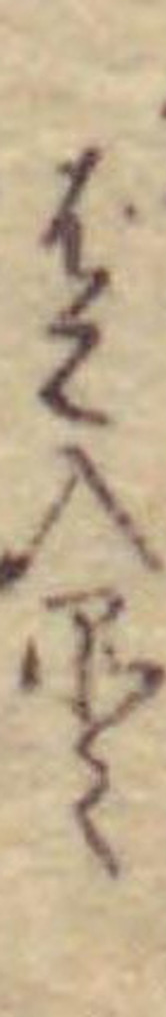ばこ入品々
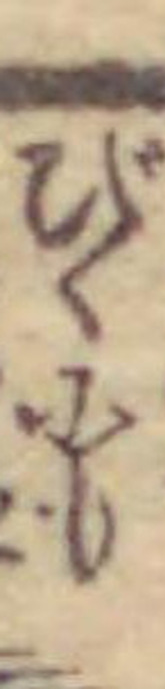びくにも
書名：御誂染長寿小紋 : 3巻
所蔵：国立国会図書館 National Diet Library, JAPAN
